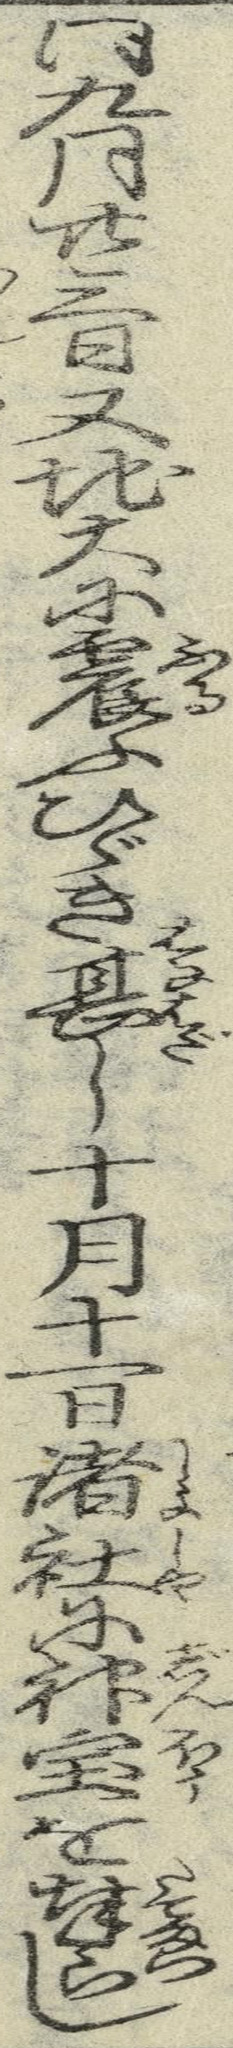同九月廿三日又地大に震ふひヾき甚し十月十一日諸社に神宝を奉らし
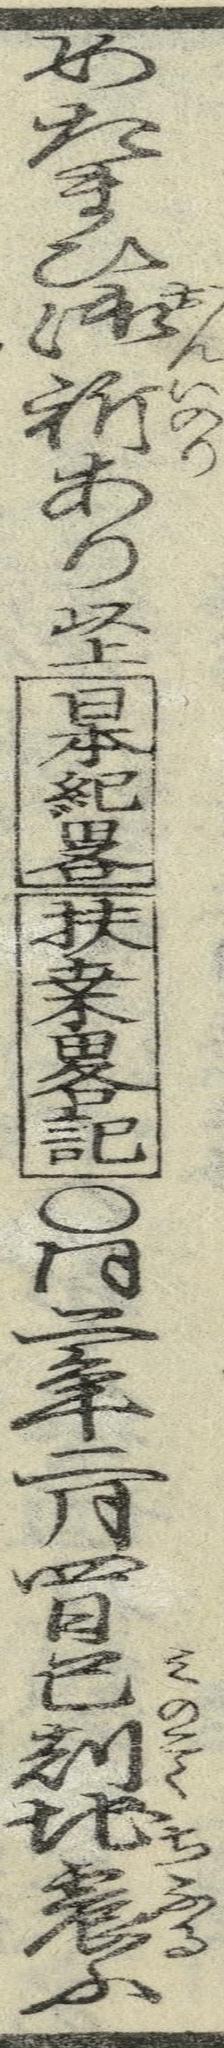めたまひ御祈あり以上日本紀略扶桑略記〇同二年二月四日巳刻地震ふ
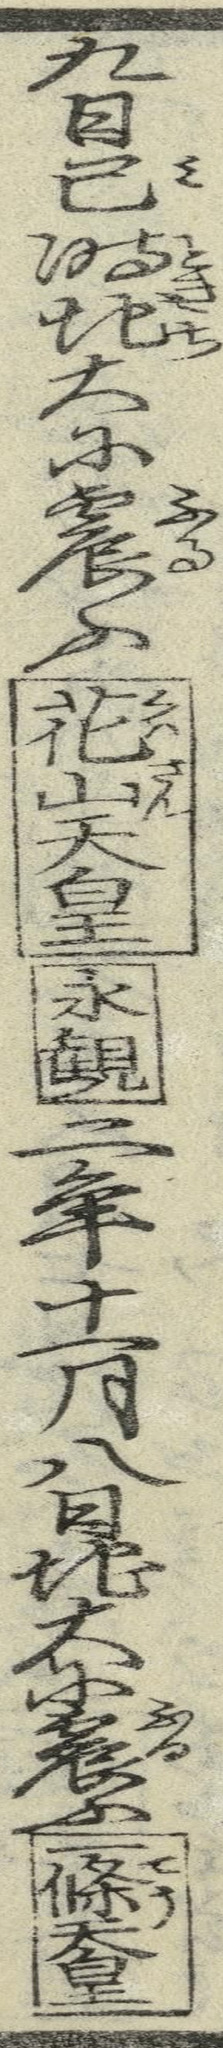九日巳時地大に震ふ花山天皇貞観二年十一月八日地大に震ふ一條天皇
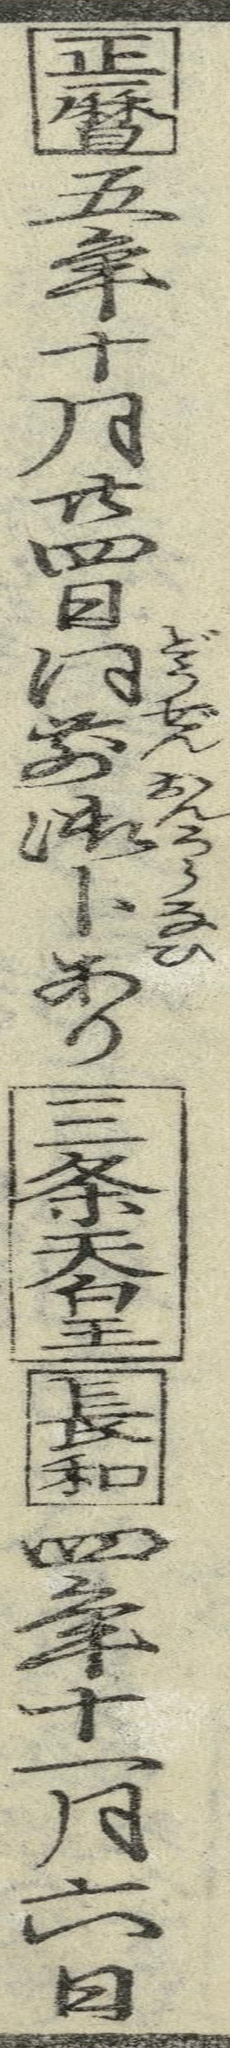正暦五年十月廿四日同前御卜あり三条天皇長和四年十一月六日
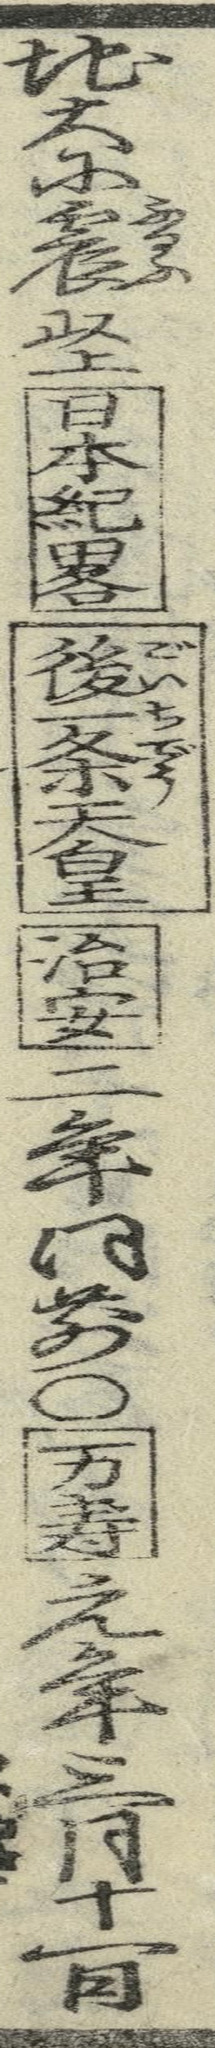地大に震以上日本紀略後一条天皇治安二年同前〇万寿元年三月十一日
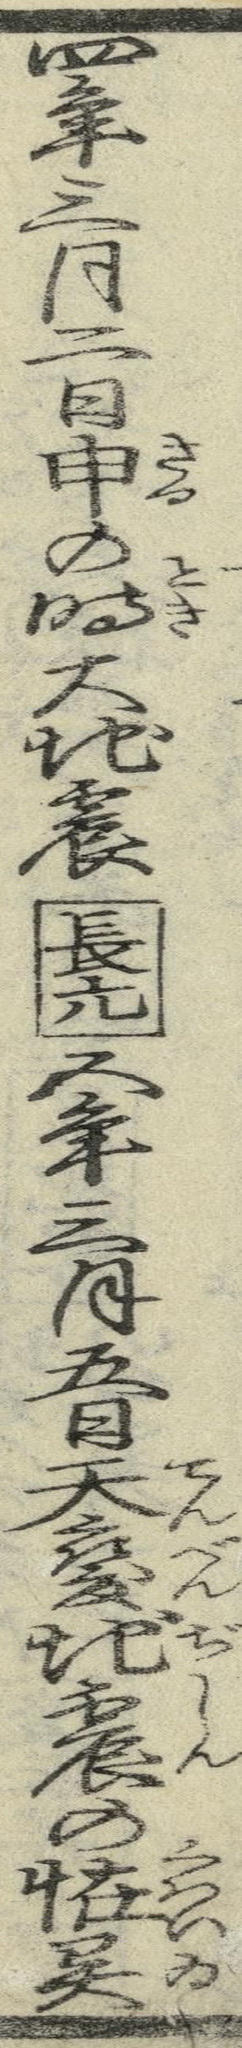四年三月二日申の時大地震長元五年三月五日天変地震の怪異

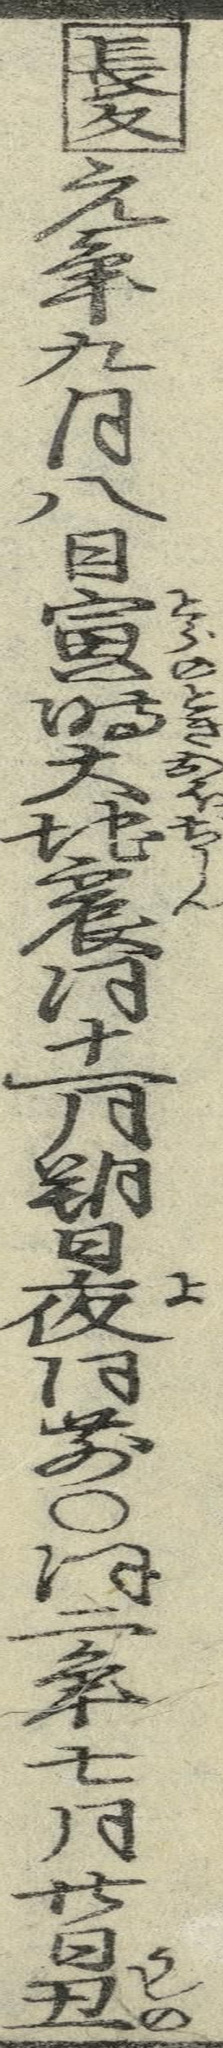長久元年九月八日寅時大地震同十一月朔日夜同前〇同二年七月廿日丑
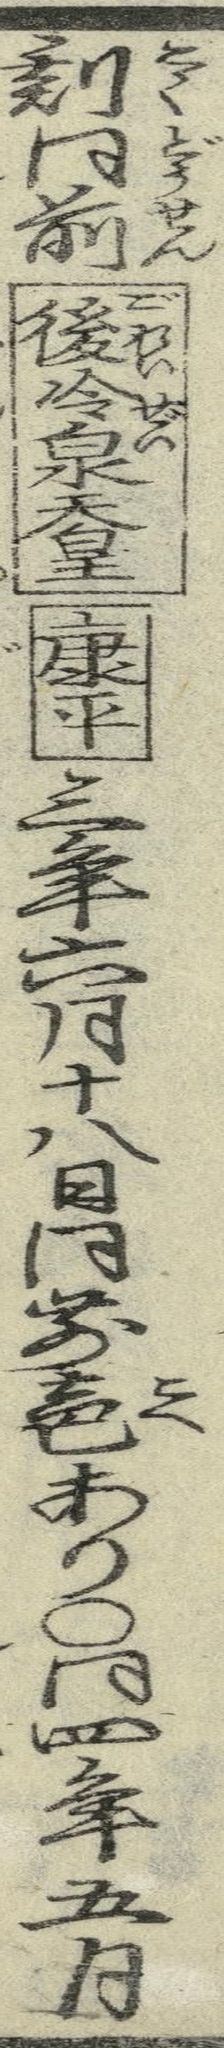刻同前後冷泉天皇康平三年六月十八日同前声あり〇同四年五月
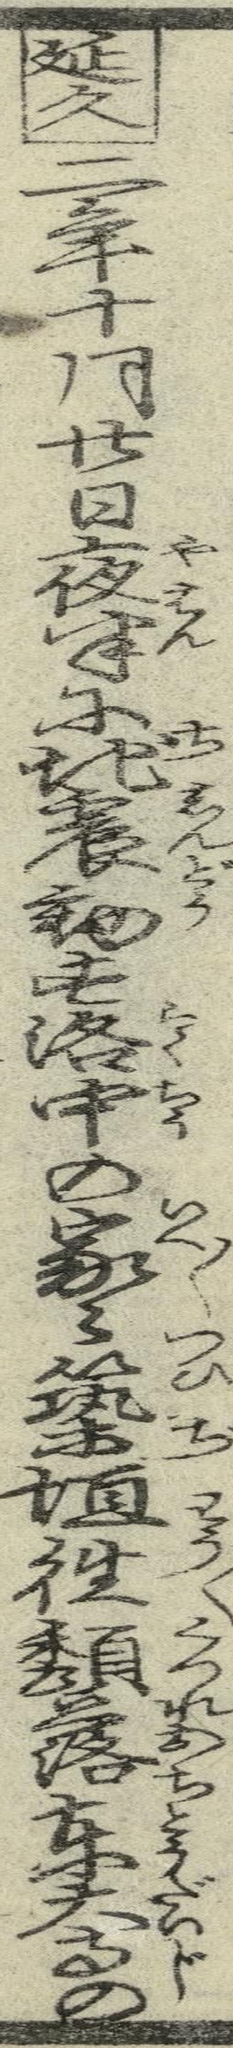延久二年十月廿日夜半に地震動す洛中の家〻築垣往頽落東大寺の
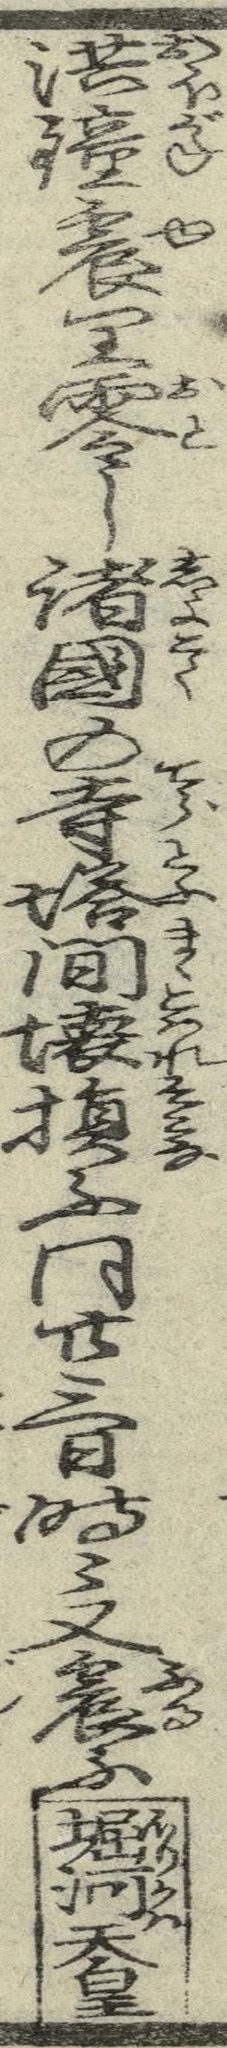洪鐘震り零し諸国の寺塔間壊損ふ同廿三日時〻又震ふ堀川天皇
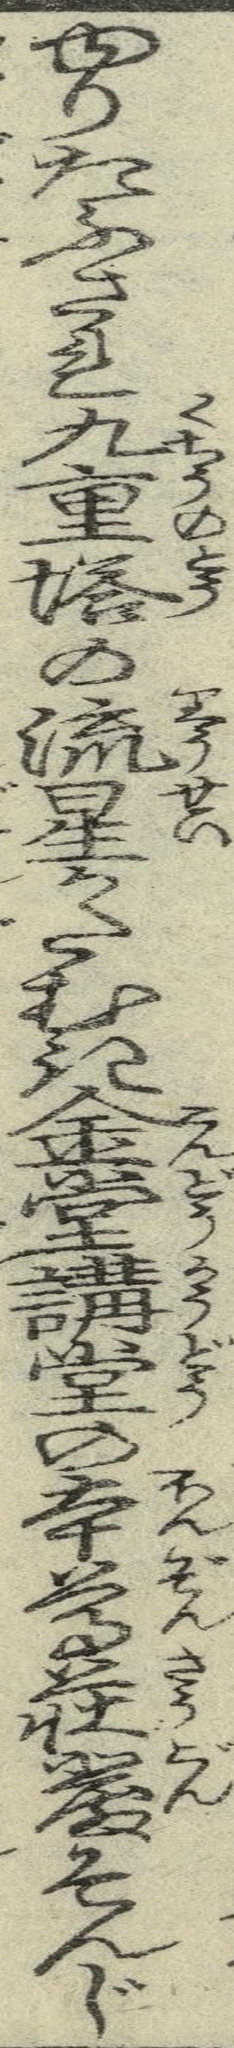ゆりたふされ九重塔の流星かたむき金堂講堂の本尊荘厳そんじ
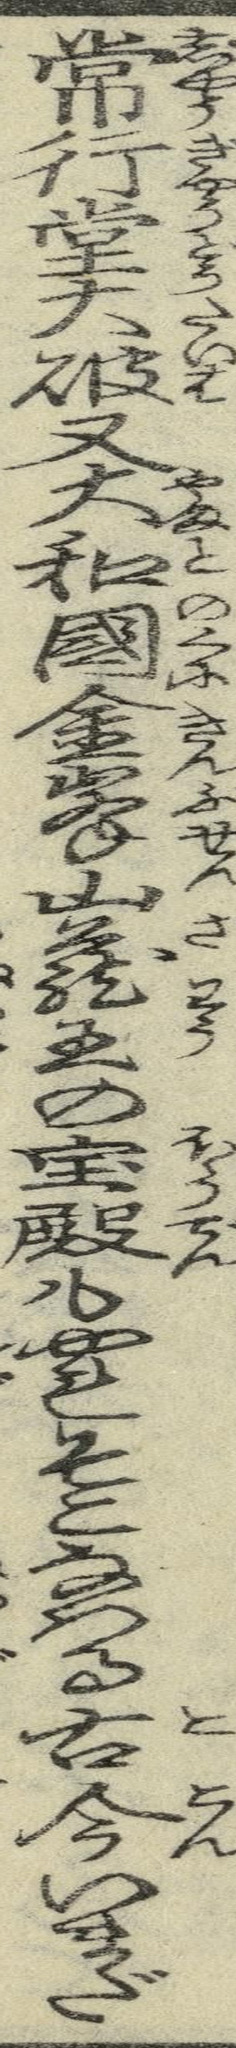常行堂大破又大和国金峯山蔵王の宝殿もゆれそこなはる古今いまだ
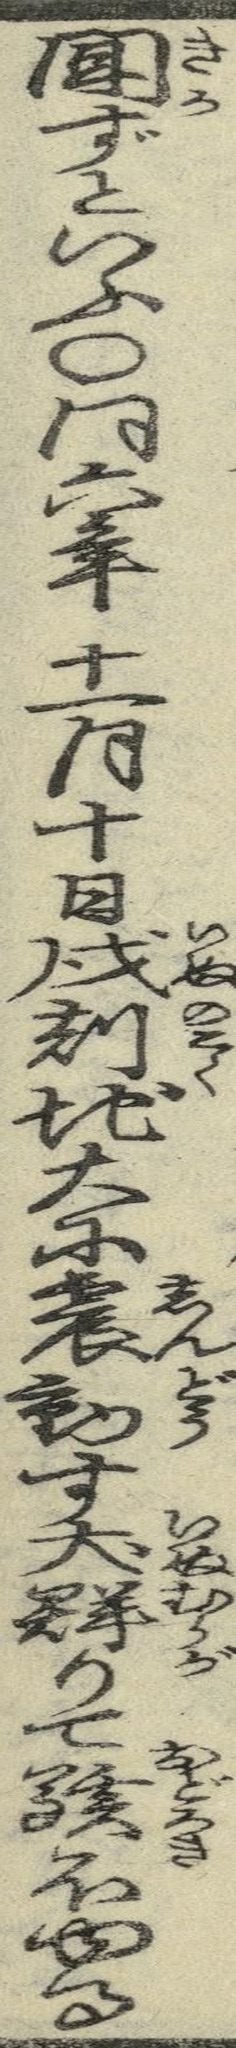聞ずといふ〇同六年十一月十日戌刻地大に震動す犬群りて駭ほゆる
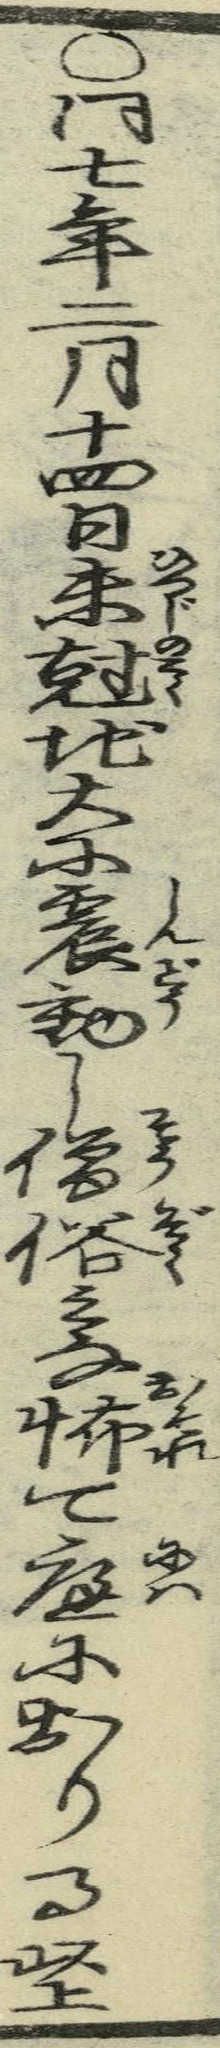〇同七年二月十四日未尅地大に震動し僧俗みな怖て庭におりる以上
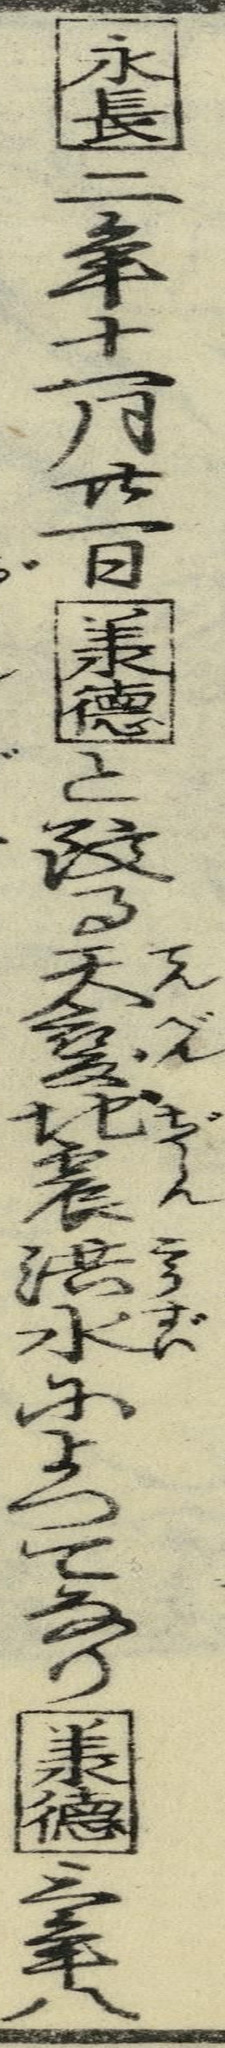永長二年十一月廿一日承徳と改る天変地震洪水によつてなり承徳三年八
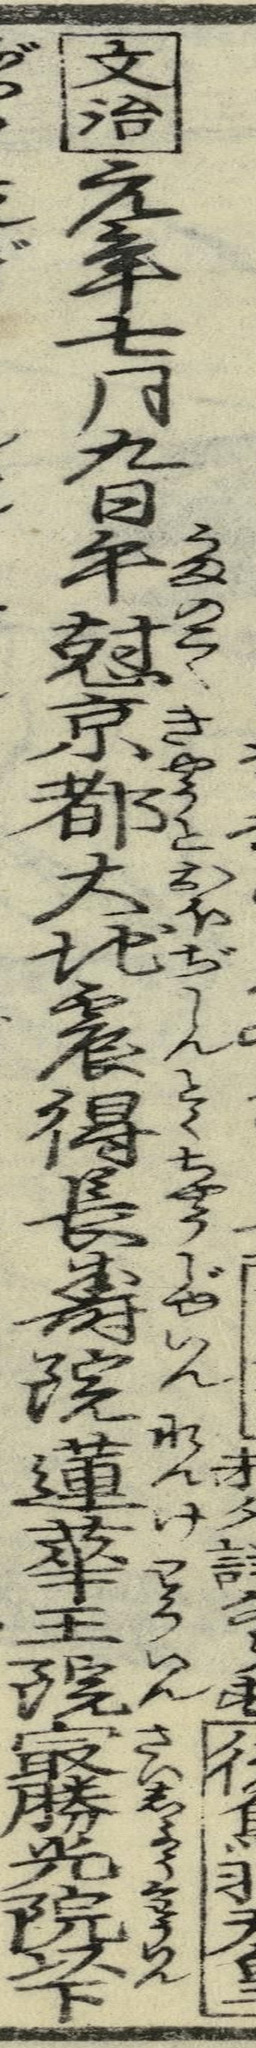文治元年七月九日午尅京都大地震得長寿院蓮華王院最勝光院以下
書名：地震年代記
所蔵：東京大学地震研究所図書室 Earthquake Research Institute Library, The University of Tokyo, JAPAN
